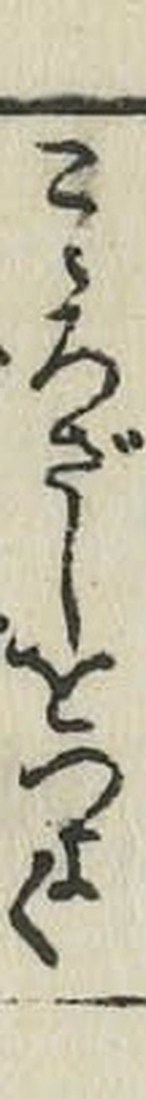こゝろざしをつよく
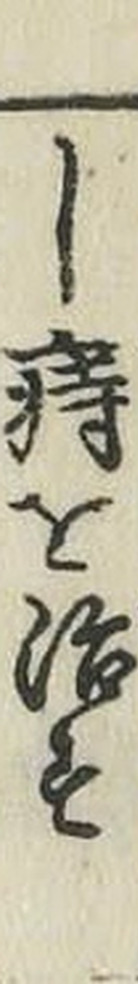し痔を治す
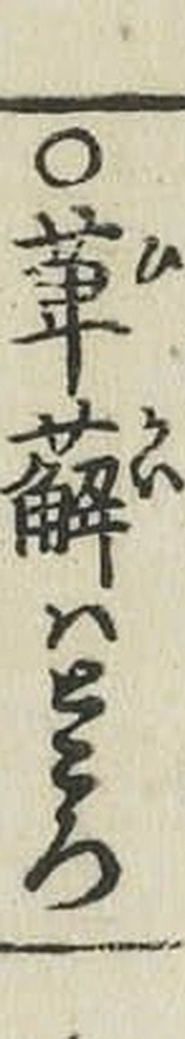○萆薢はところ
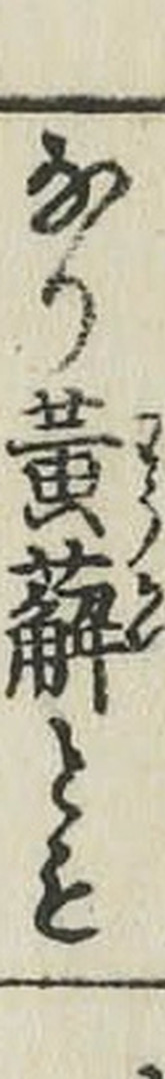なり黄薢とも
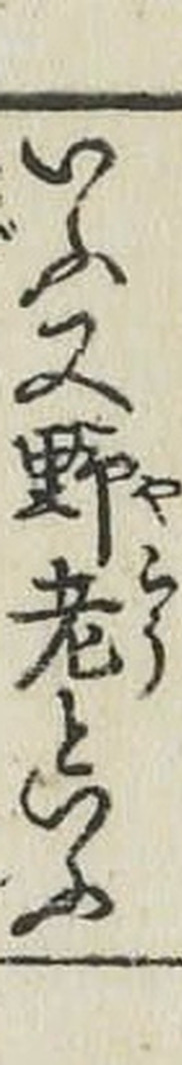いふ又野老といふ
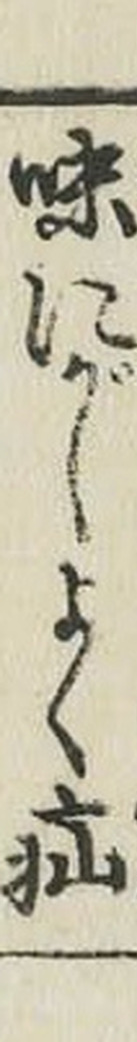味にがしよく疝
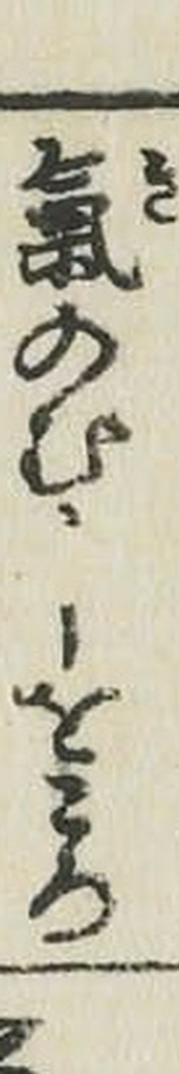気のむしをころ
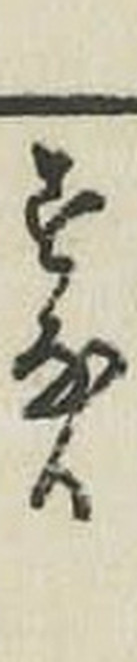すなり
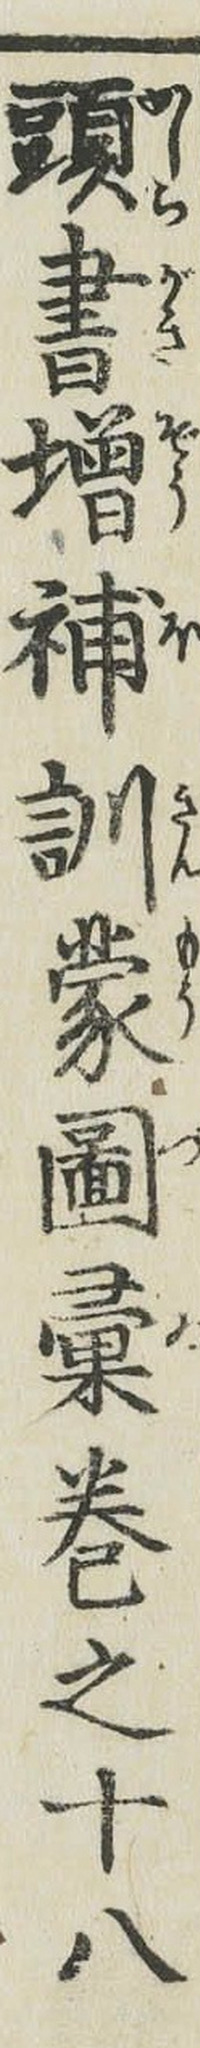頭書増補訓蒙図彙巻之十八
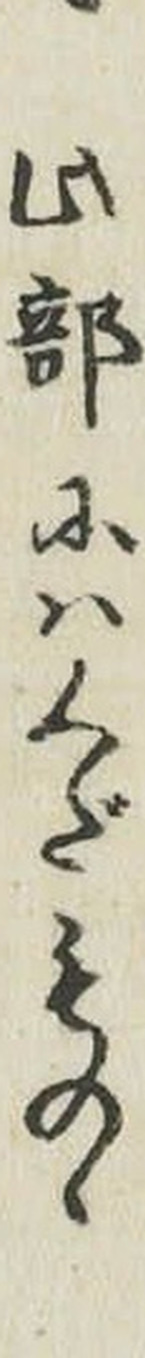此部にはくだものゝ
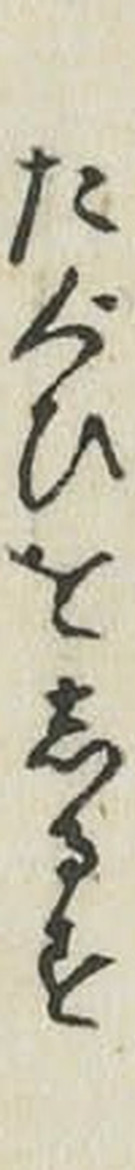たぐひをしるす
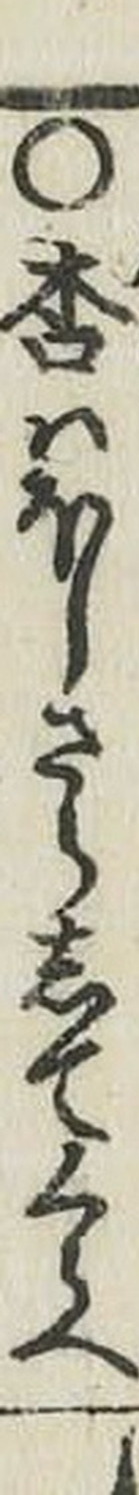○杏はほしさらしてくらへ
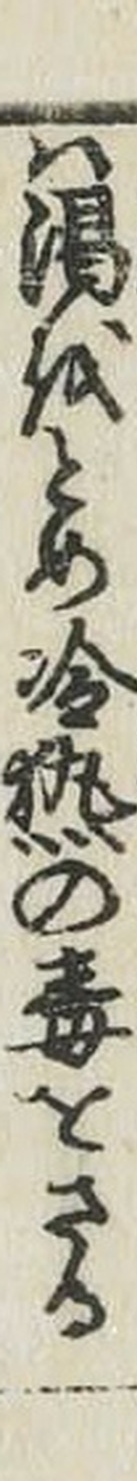は渇をとめ冷熱の毒をさる
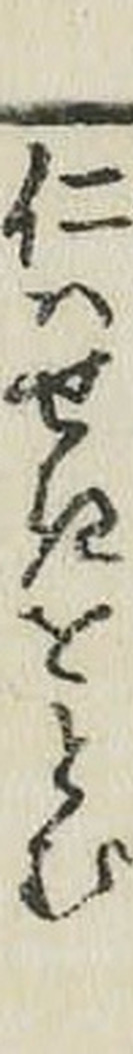仁はせきをとむ
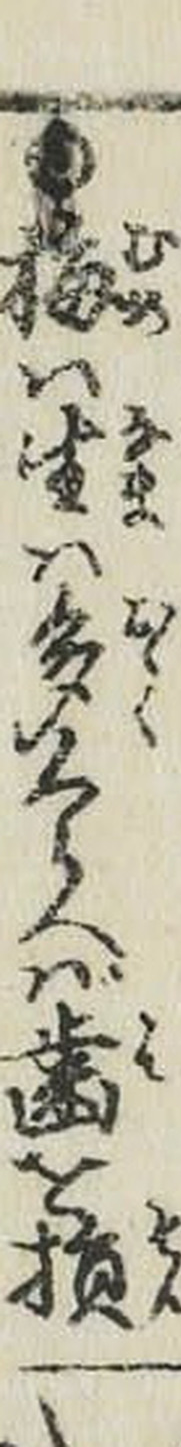○梅は生は多くらへば歯を損
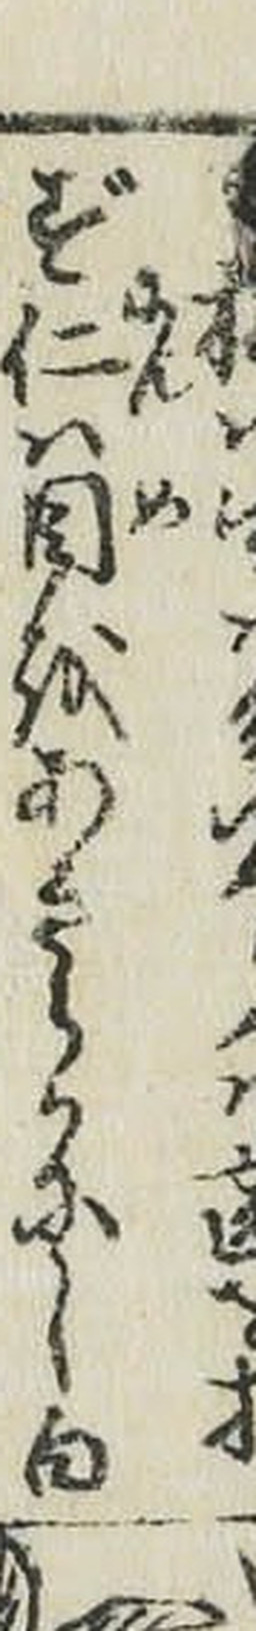ず仁は目をあきらかにし白
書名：増補頭書訓蒙図彙大成 10巻 8:巻之17-19
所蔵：東京学芸大学教育コンテンツアーカイブ
